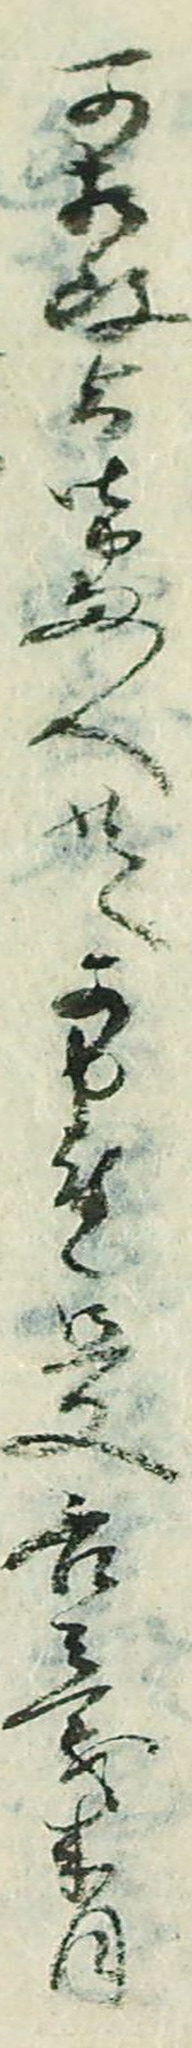可相改旨御番人共へ可申付候且又否之義来月
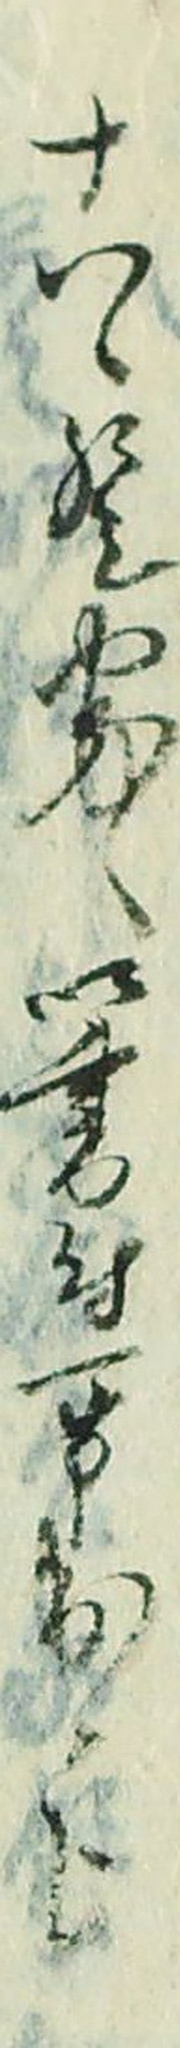十八日野宅へ以書付可申出候以上
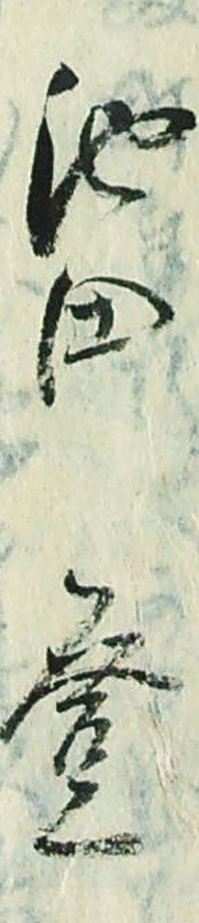池田登
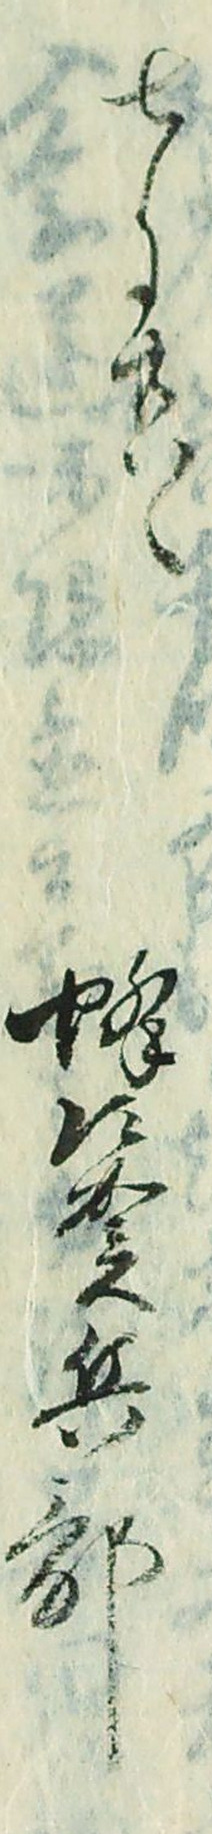七月廿八日蜂須賀兵部
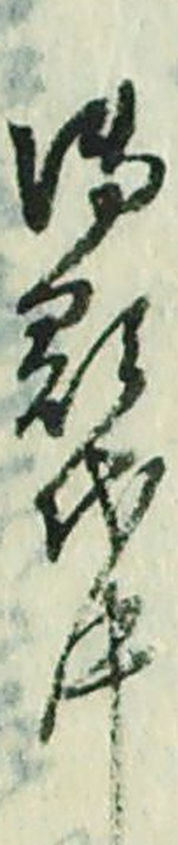御郡代中
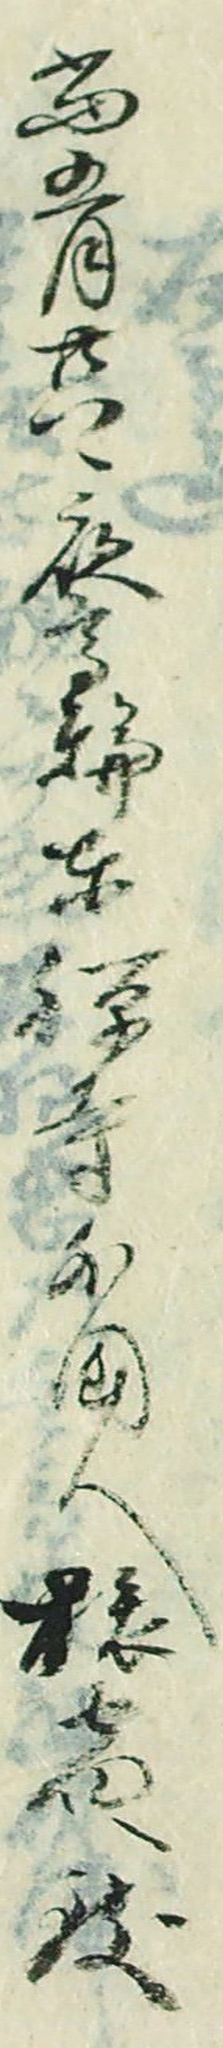当五月廿八日夜高輪東禅寺外国人旅宿へ致
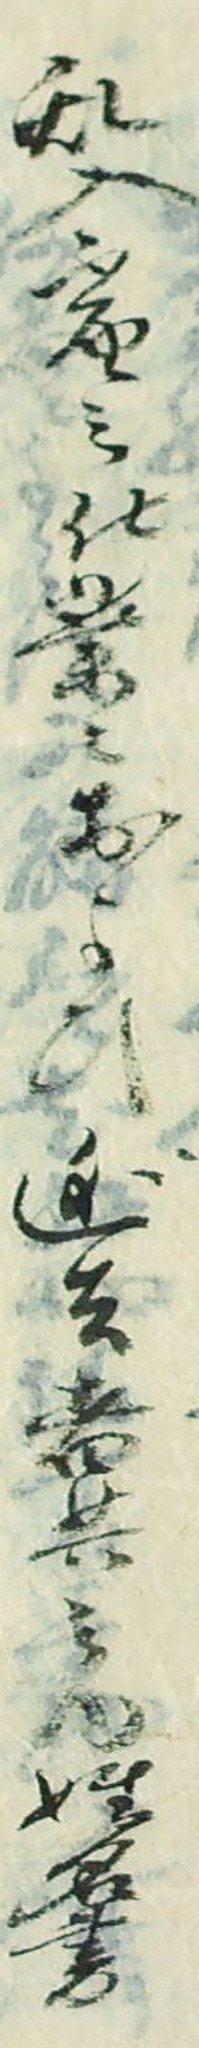乱入不届之仕業におよひ逃去者共之内姓名書
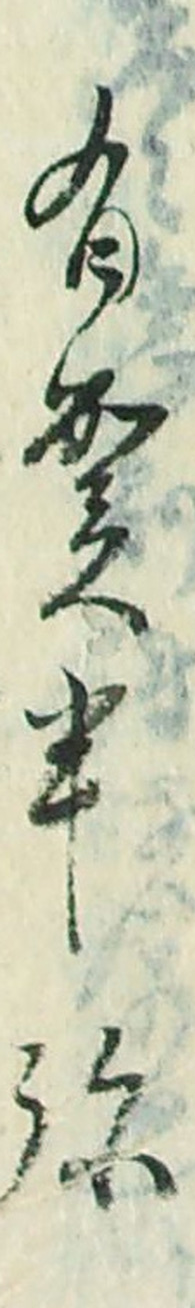有賀半弥
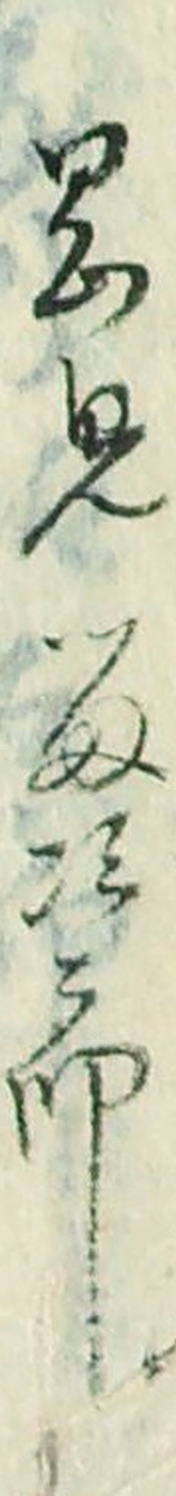岡見留次郎
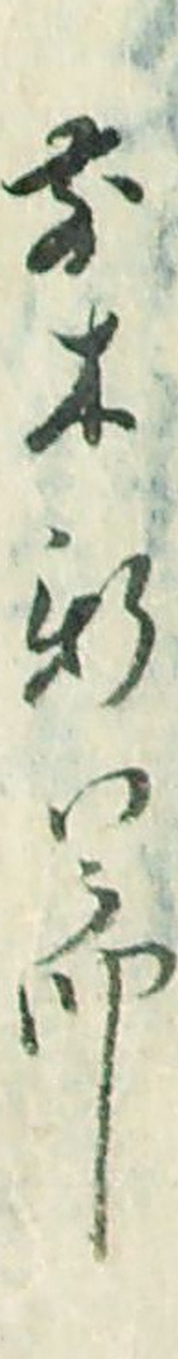前木新八郎

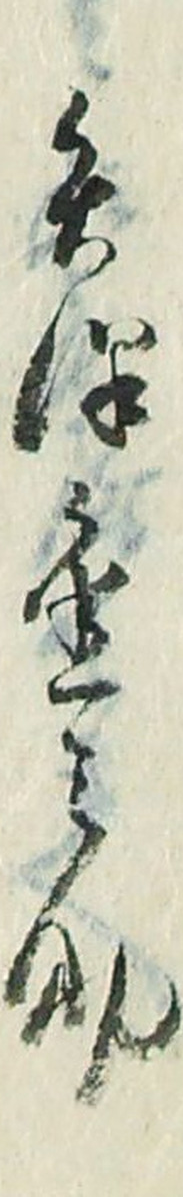矢沢金之助
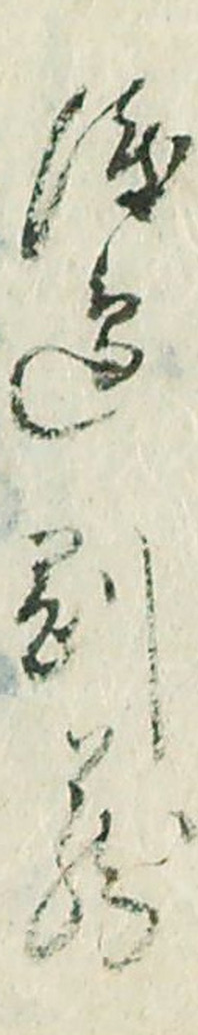渡辺剛蔵
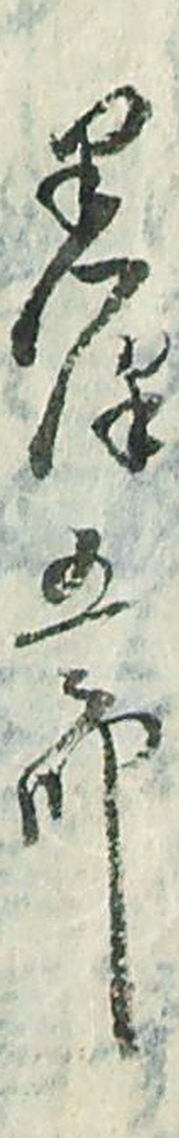黒沢五郎
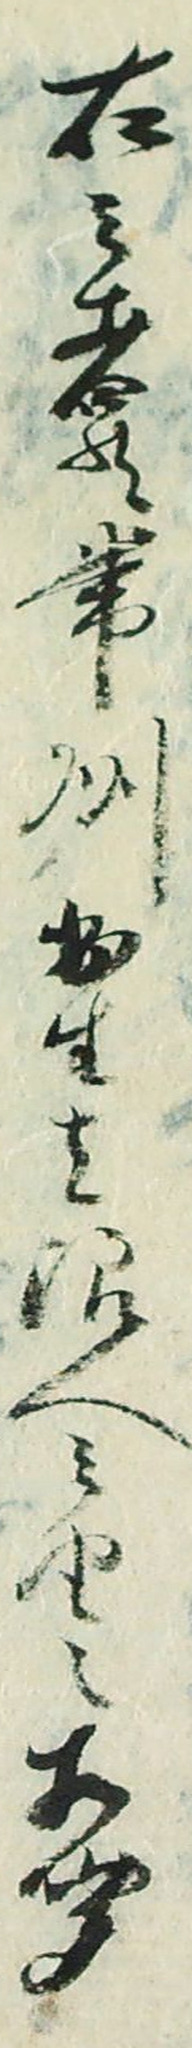右之者共常州出生者浪人之由に相聞
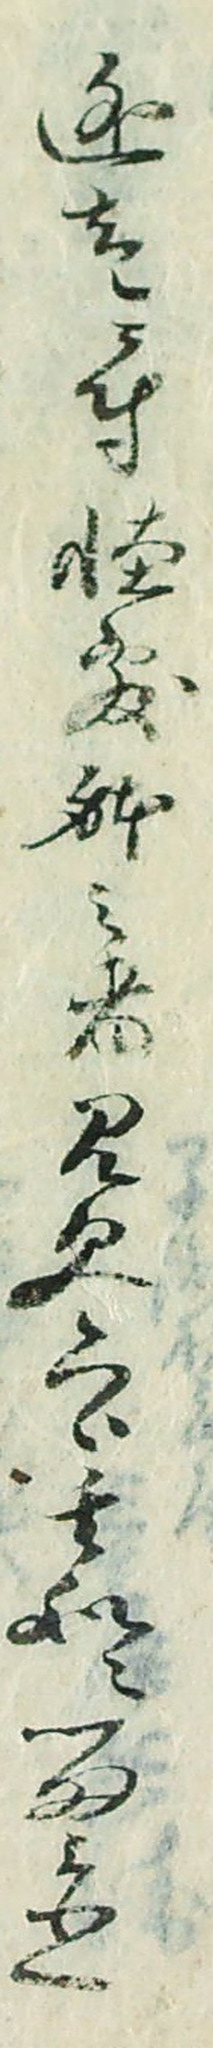逃去候に付怪敷体之者見受候へは其処に留置
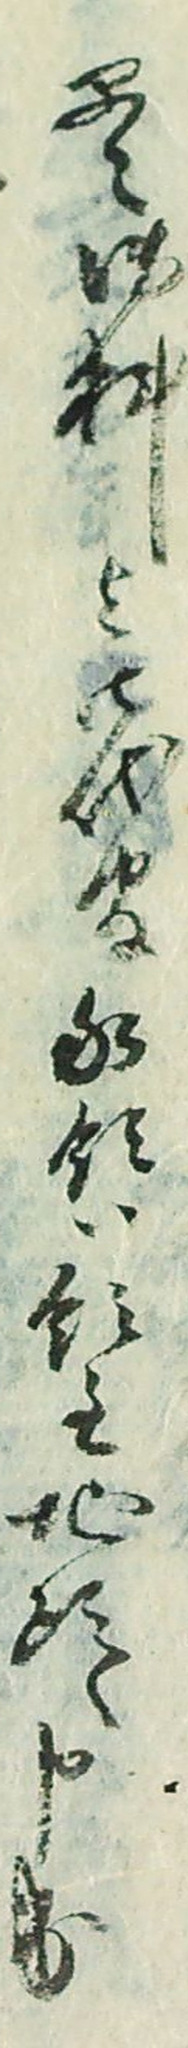早々御料は御代官私領は領主地頭申出
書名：諸御用御□受書控
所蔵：鳴門教育大学 Naruto University of Education
